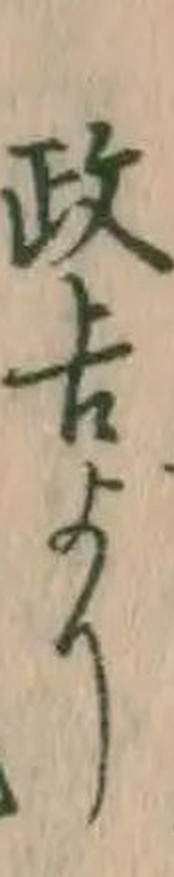政吉より
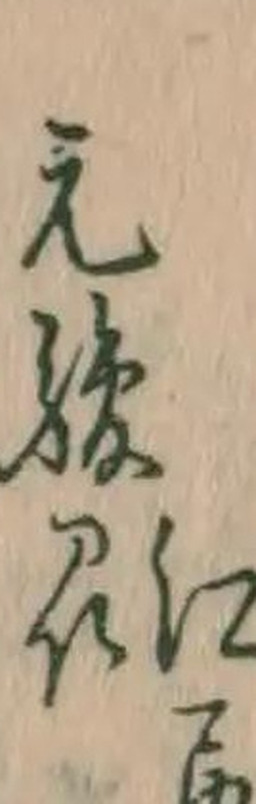元駿州
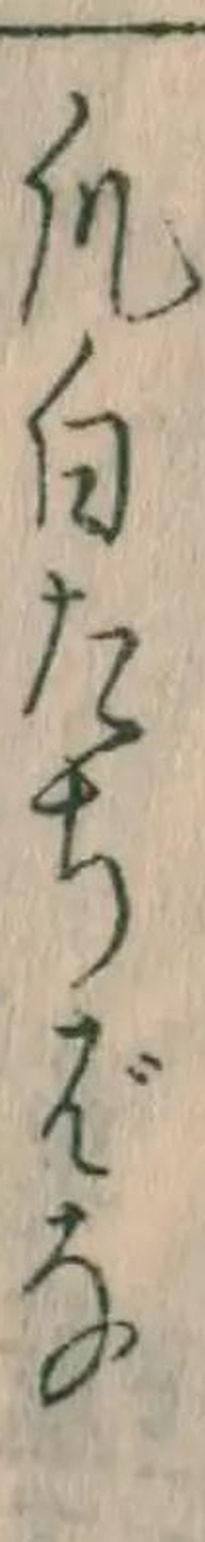爪白たちばな
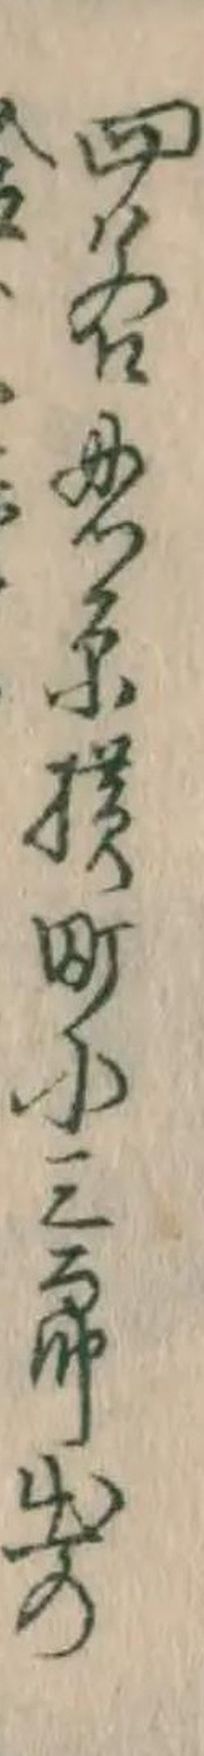四谷忍原横町小三郎出の
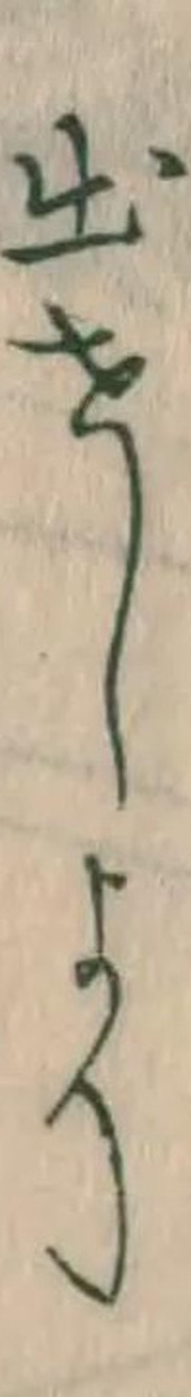出せしより
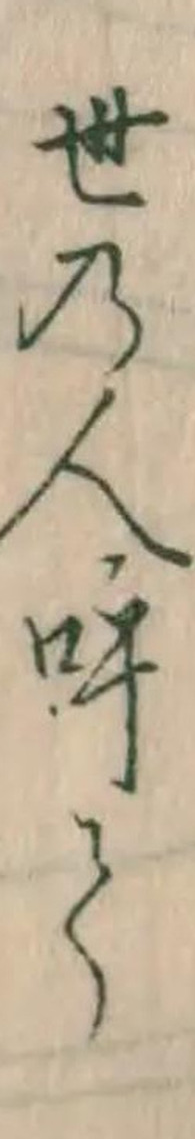世の人呼て
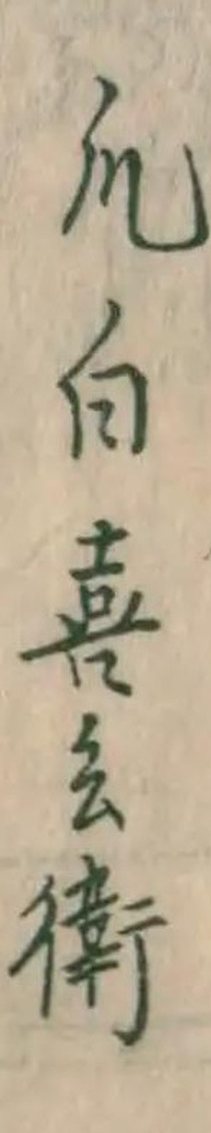爪白喜兵衛
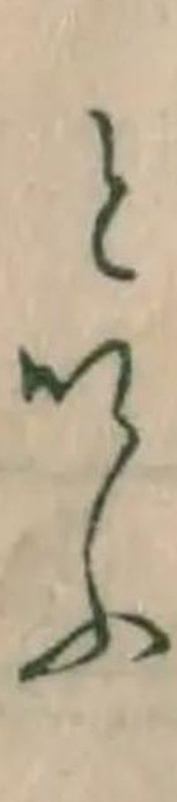といふ

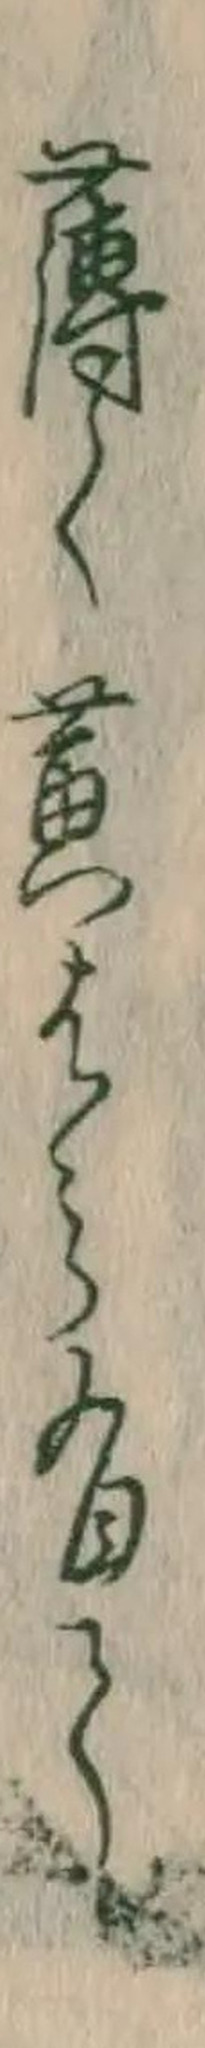薄く黄はみ有て
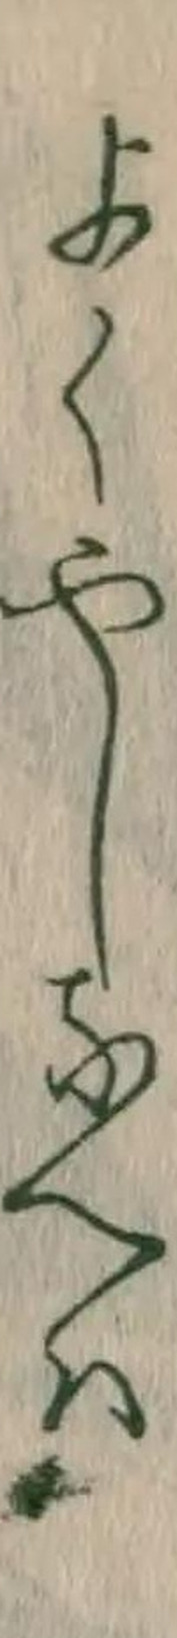よくやしなへは
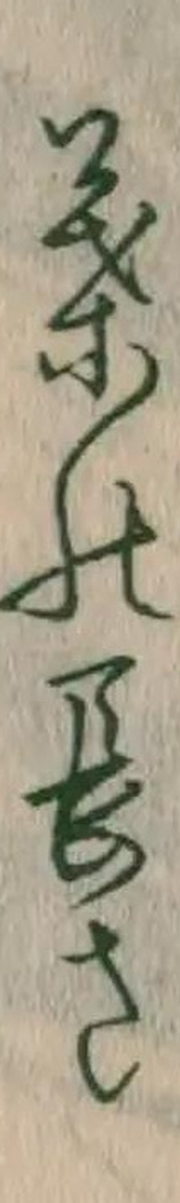葉の長さ
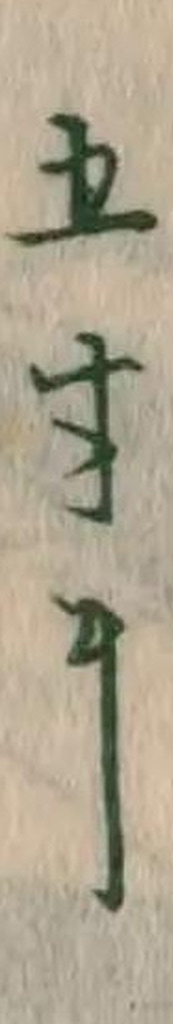五寸に
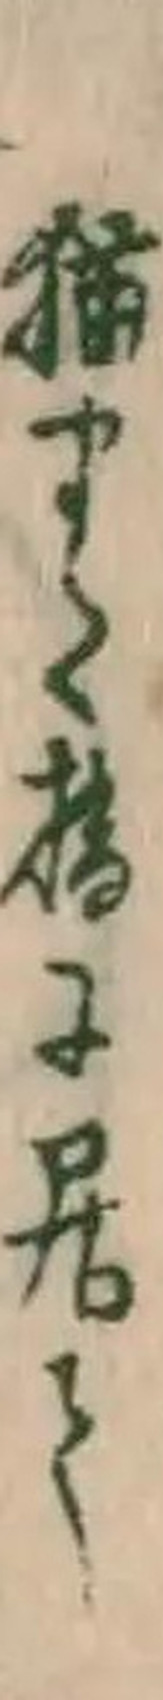猫また橋に居て
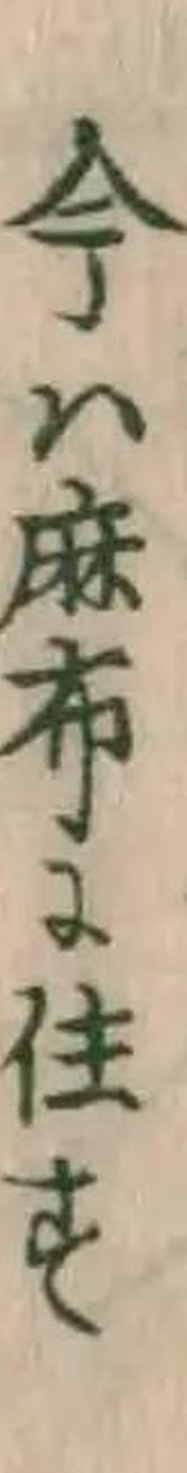今は麻布に住す
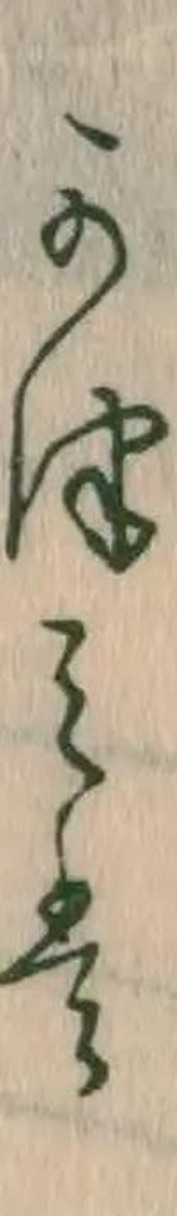かつみは
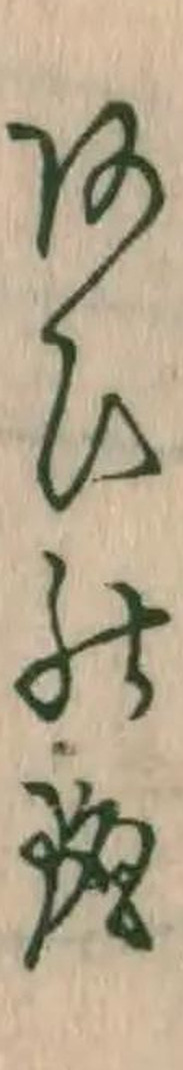あひの斑
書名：草木奇品家雅見 3巻. [3]
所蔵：国立国会図書館 National Diet Library, JAPAN
